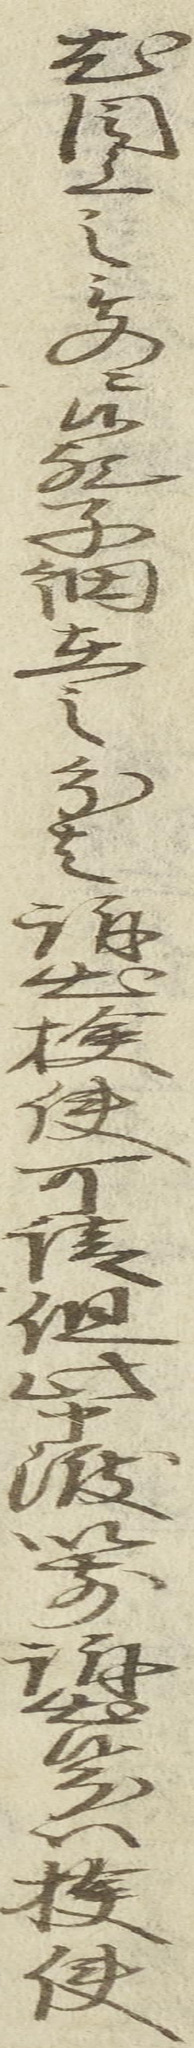尤同上のものニ候歟子細在之分者訴出検使可請但此申渡以前訴出候分は検使
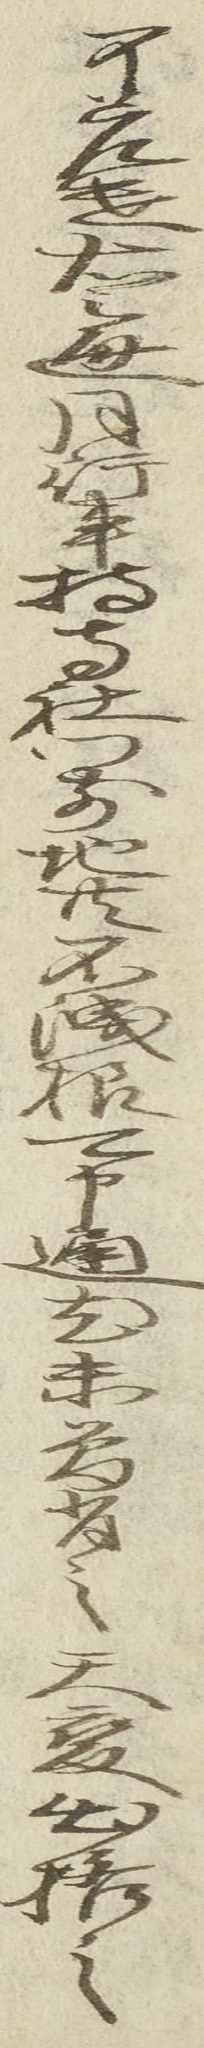可差遣右之通月行事持寺社門前地共不洩様可申通尤未曾有之天変出格之
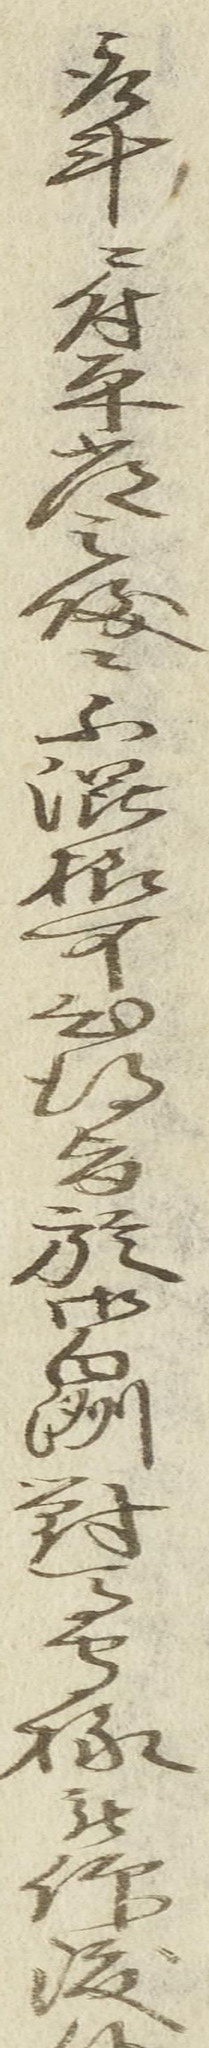取斗ニ付平常之儀ニ不混様可心得旨於御白洲対馬守様被仰渡候
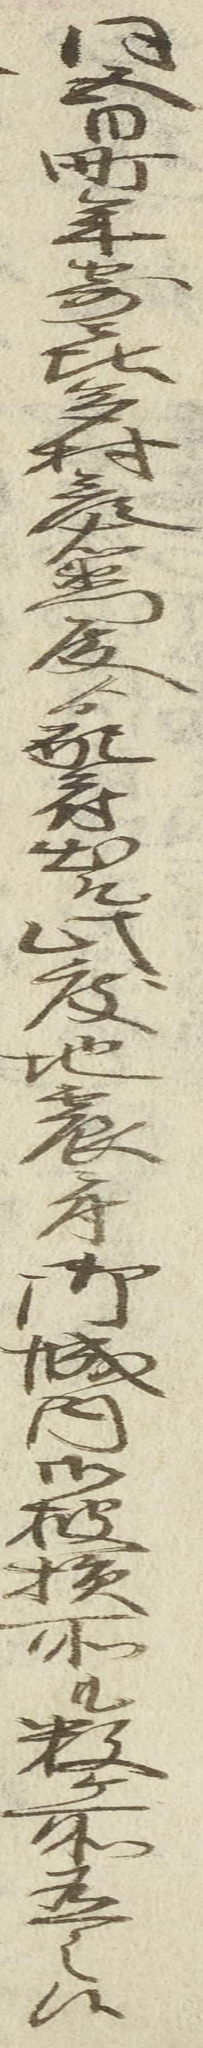一同五日町年寄喜多村彦右衛門殿ゟ配符出ル此度地震ニ付御城内御披損所も数ヶ所在之候
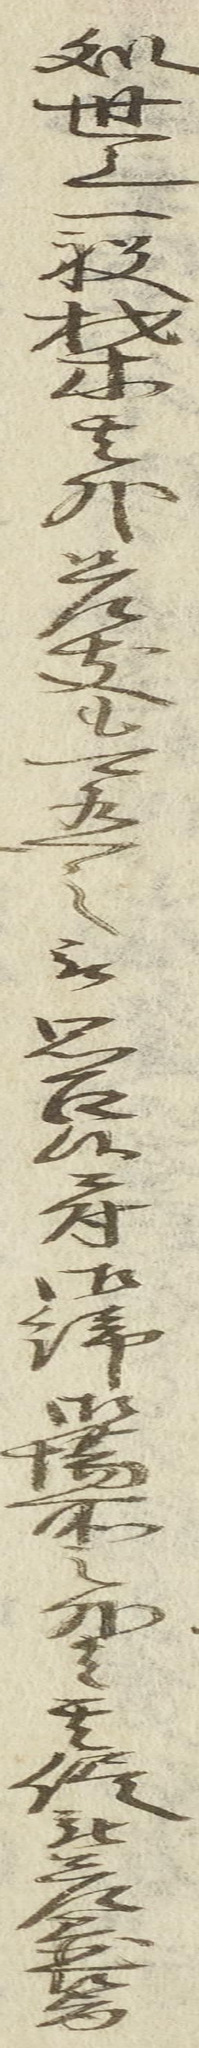処世上一般材木其外差支も可有之被思召候ニ付御締御場所之外者其侭被差置候旨
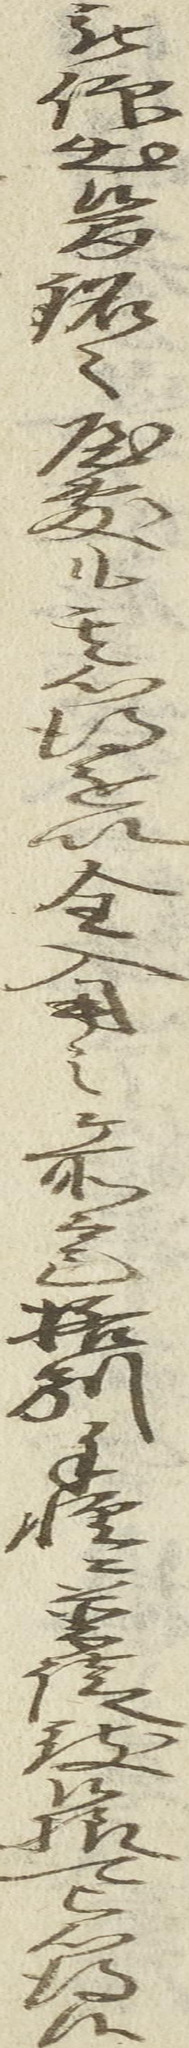被仰出候間銘々屋敷も其心得を以全入用之ケ所而已格別手軽ニ普請致候様可被心得候
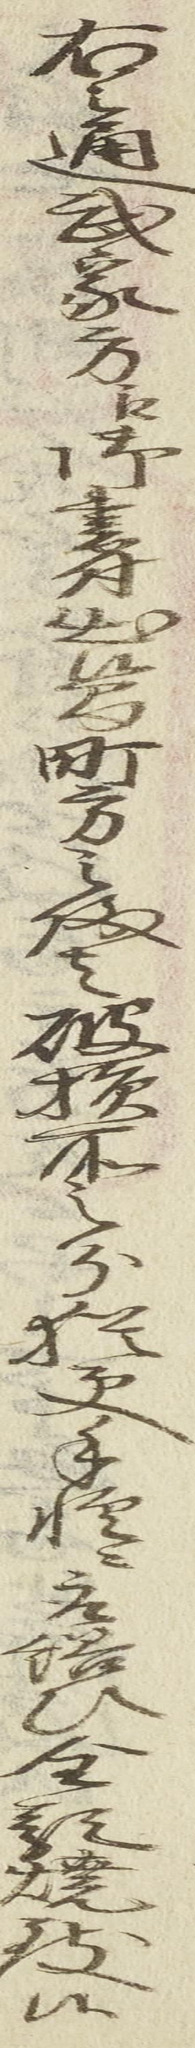右之通武家方江御書付出候間町方之儀者破損所之分猶更手軽ニ取繕ひ全類焼致候
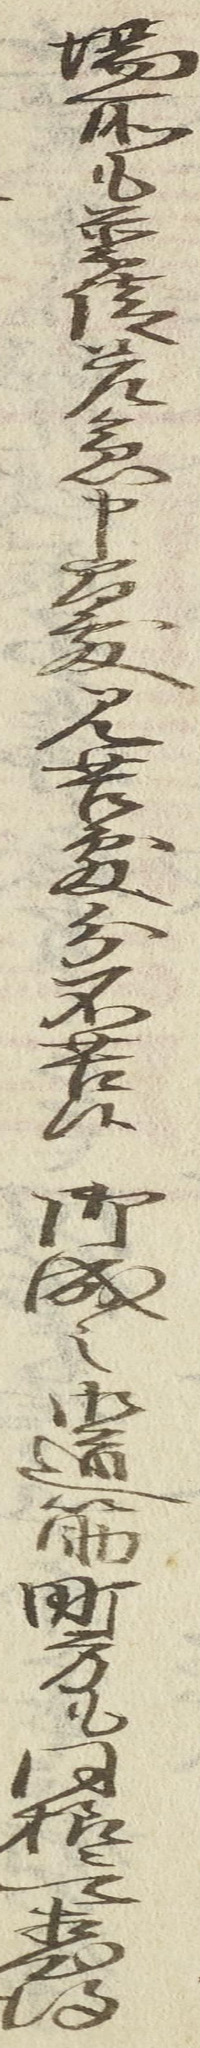場所も普請差急申間敷見苦敷分不苦候御成之御通筋町方も同様ニ可相心得
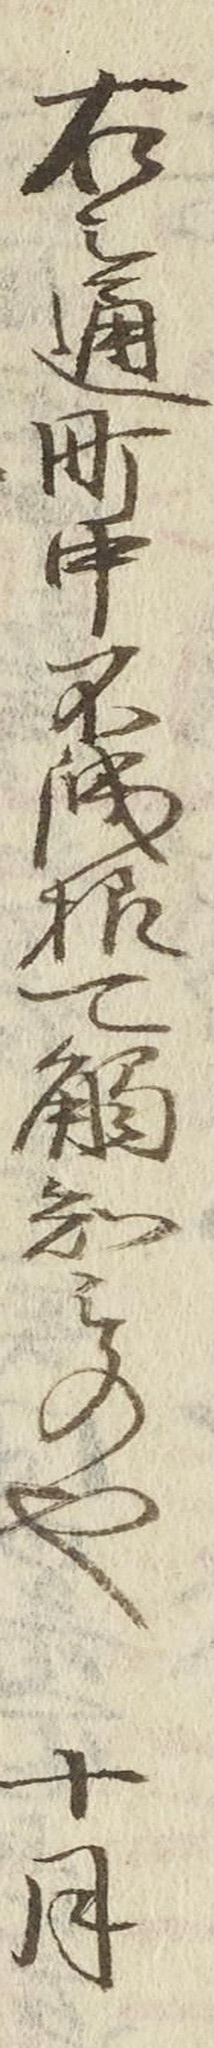右之通町中不洩様可触知もの也十月
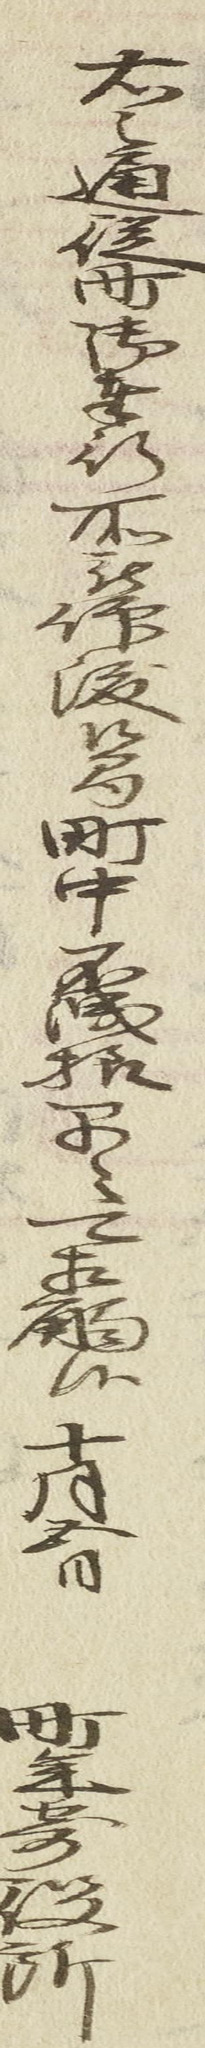右之通従町御奉行所被仰渡候間町中不洩様早々可相触候十月五日町年寄役所
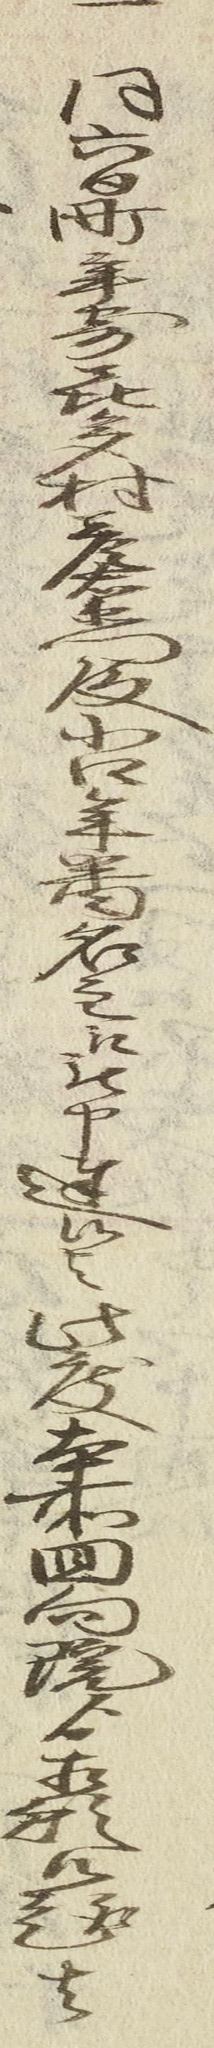一同六日年寄喜多村彦右衛門殿小口年番名主江被申達候者此度本所回向院ゟ相願候趣者
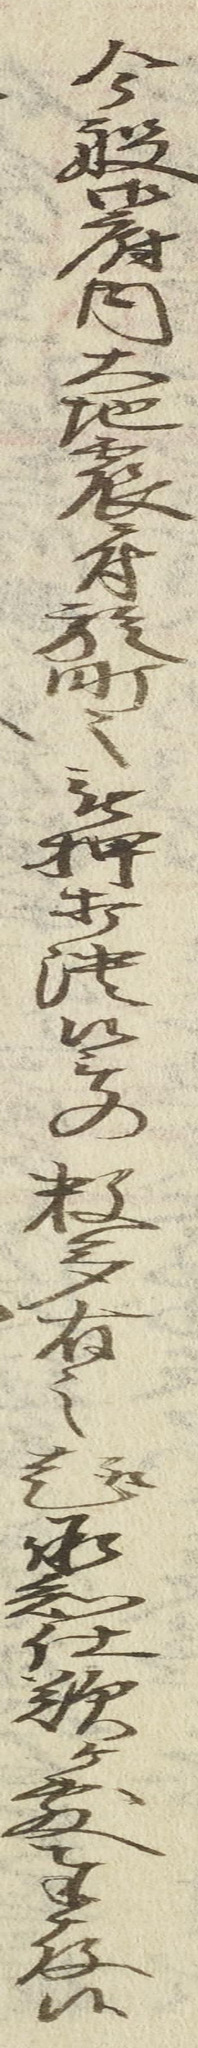今般御府内大地震ニ付於町々被押打潰候もの数多有之趣承知仕歎ケ敷奉存候
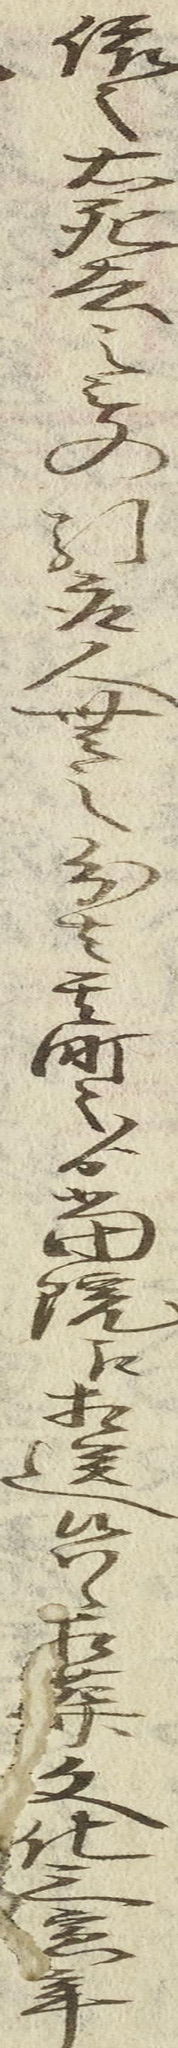依之右死去之もの引取人無之分者其町々ゟ当院江相送候はゝ相葬文化三寅年
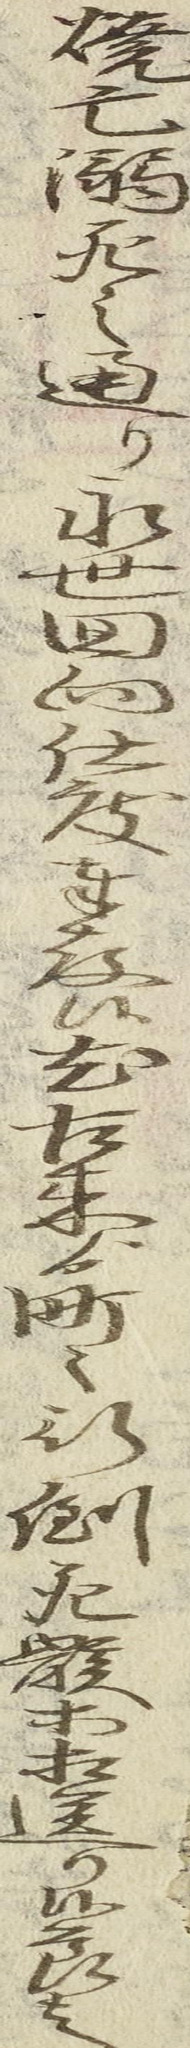焼亡溺死之通り永世回向仕度奉存候尤古来ゟ町々行倒死骸等相送り候節者
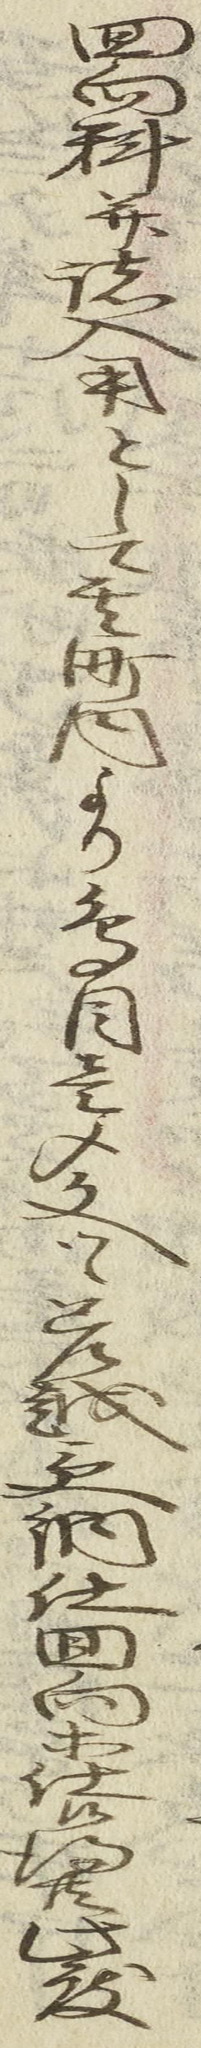回向料幷諸入用として其町内より鳥目壱〆文ツゝ差越受納仕回向等仕候得共此度
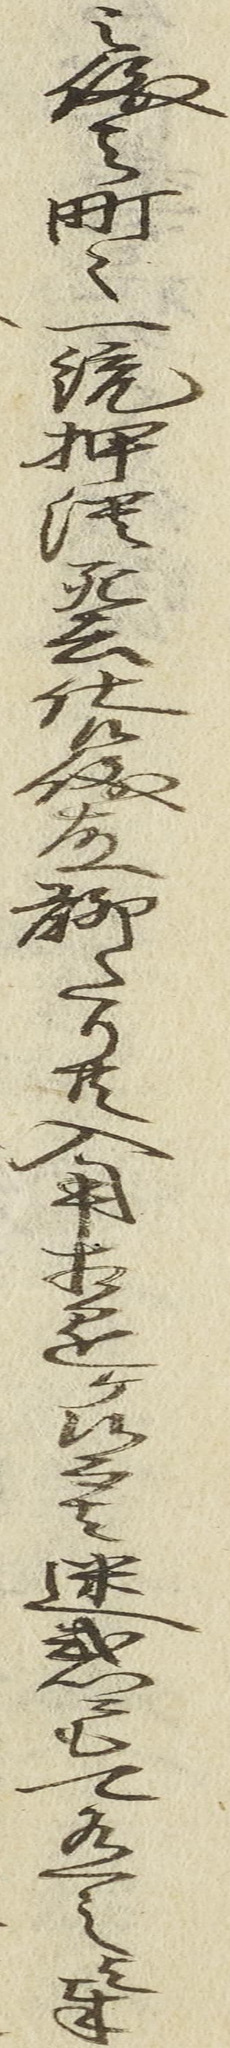之儀者町々一統押潰死去仕候儀故聊たり共入用相懸ケ候而者迷惑ニも可有之与奉
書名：安政二年震災記事　完
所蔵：東京大学地震研究所図書室 Earthquake Research Institute Library, The University of Tokyo, JAPAN
